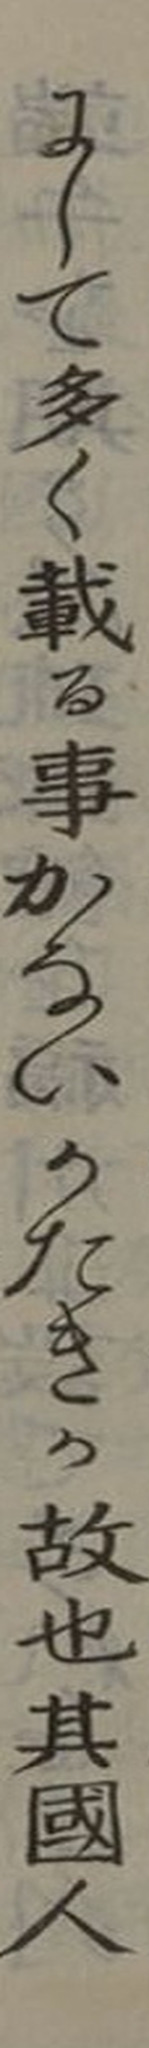にして多く載る事かないかたきか故也其國人
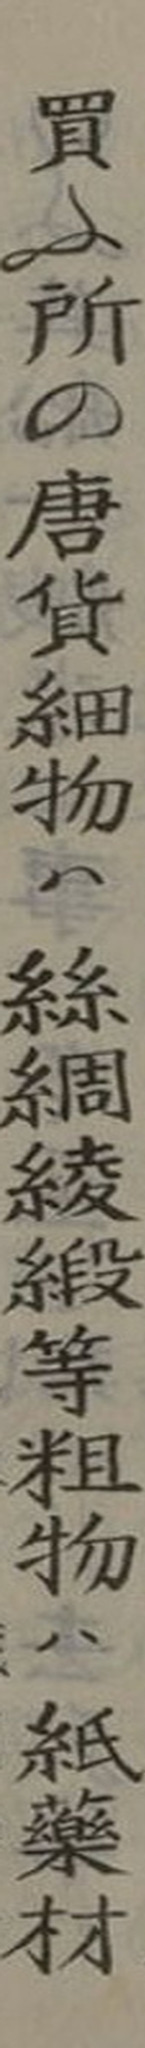買ふ所の唐貨細物は絲綢綾緞等粗物は紙藥材
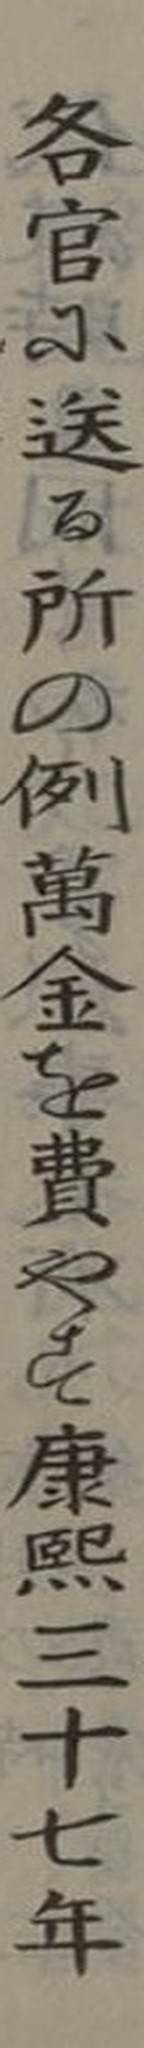各官に送る所の例萬金を費やす康熙三十七年
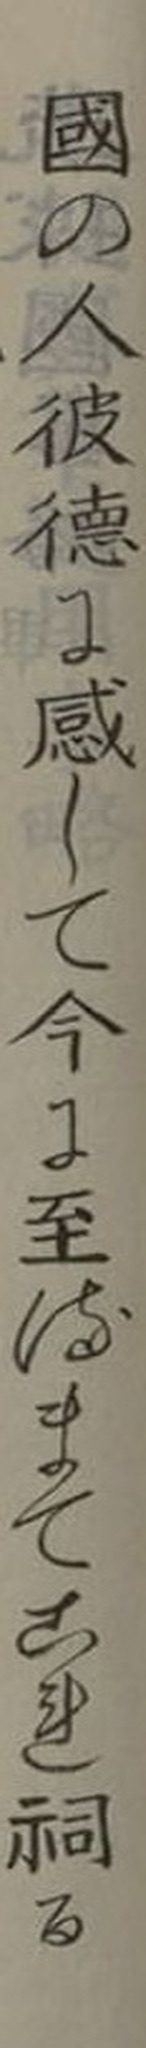國の人彼德に感して今に至るまてこれ祠る
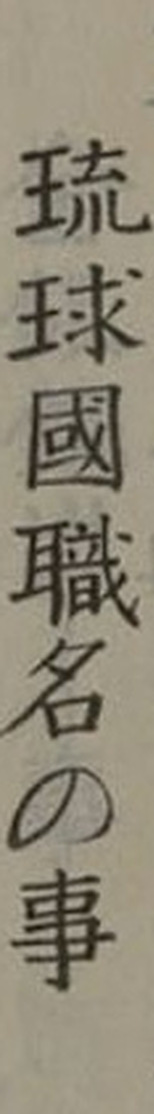琉球國職名の事
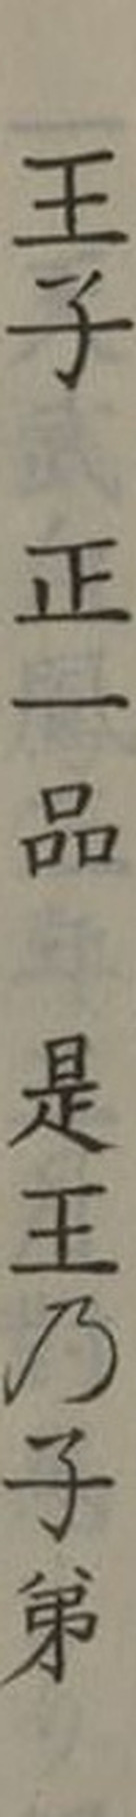王子正一品是王の子弟
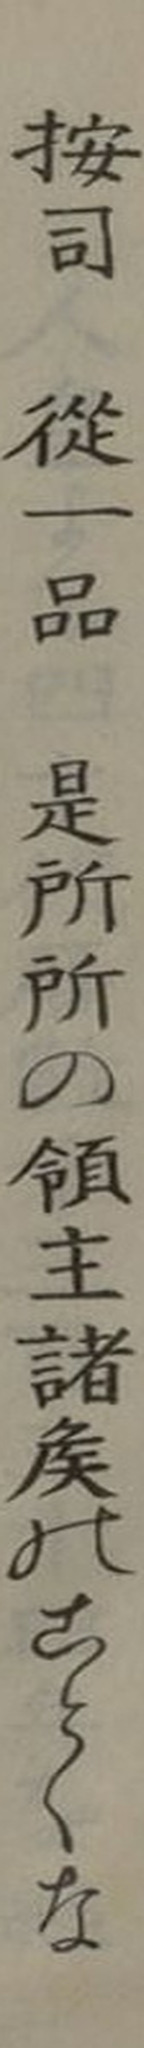按司従一品是所所の領主諸矦のことくな
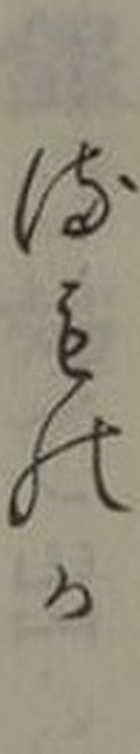るものか
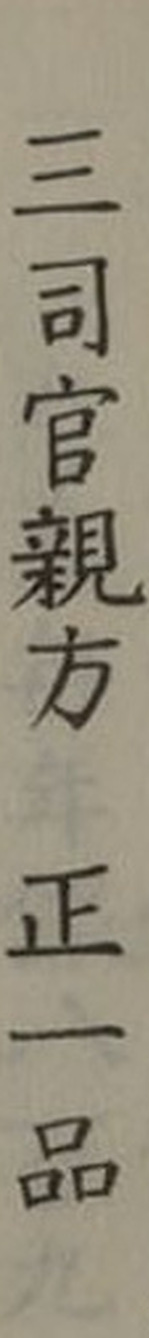三司官親方正一品
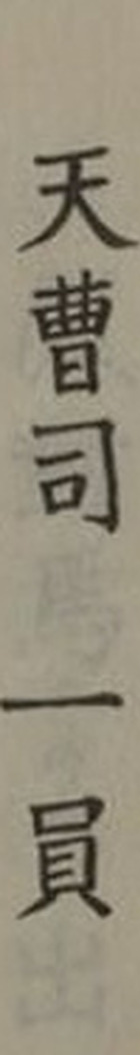天曹司一員
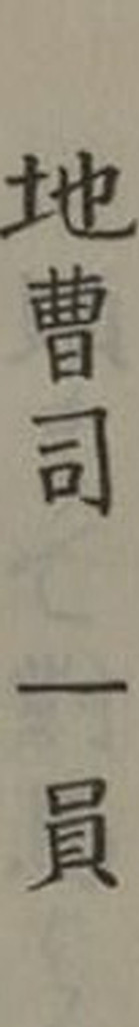地曹司一員
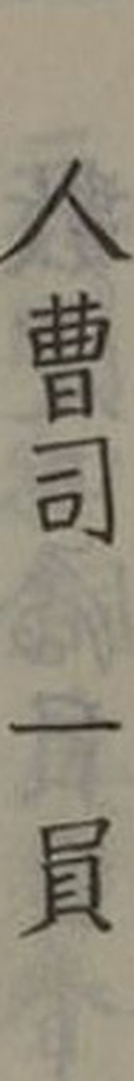人曹司一員
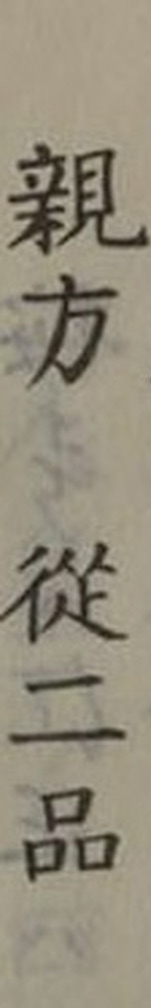親方従二品
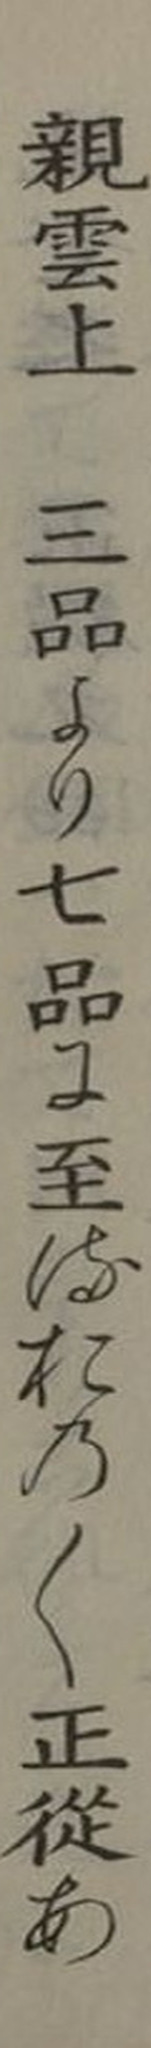親雲上三品より七品に至るおの〳〵正従あ

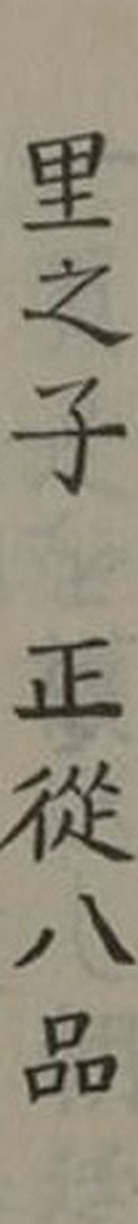里之子正從八品
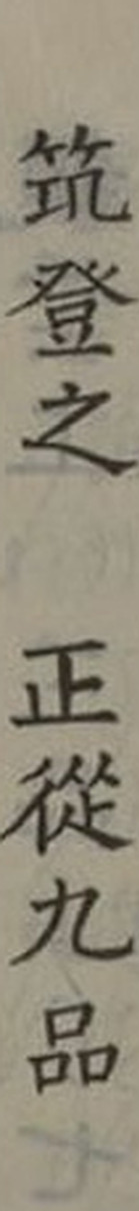筑登之正從九品
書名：骨董録
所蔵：University of the Ryukyus Library
